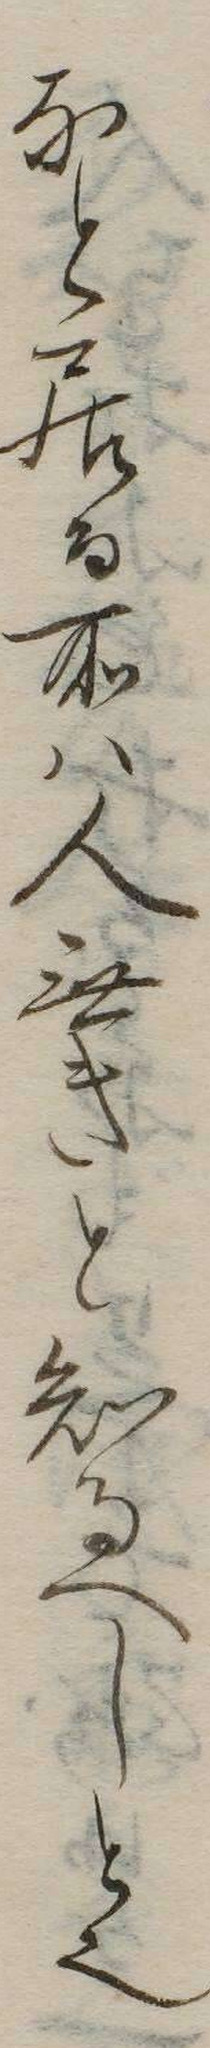なと居る所は人無きと知るへしと也
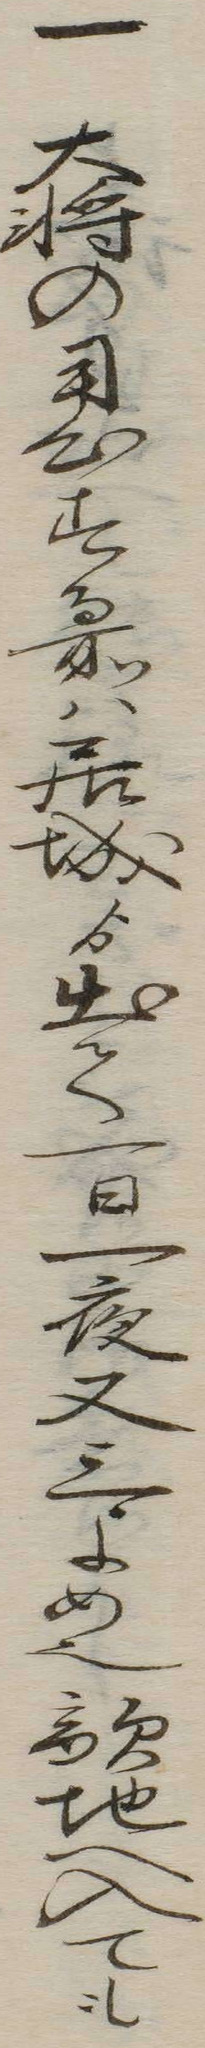一大将の用心する所は居城ゟ出て一日一夜又三よめ也敵地へ入ても
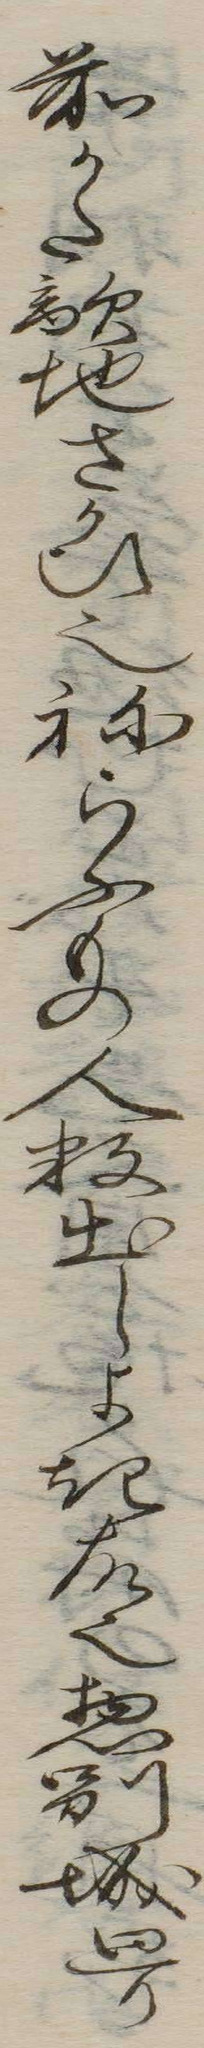前かた敵地さり行也ねらふもの人数出しよき故也惣別城廻り
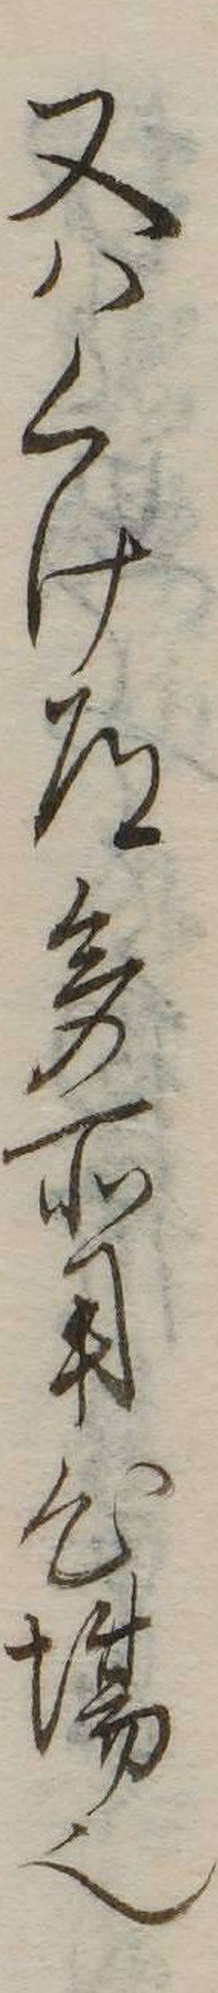又はくけ道多所用人場也
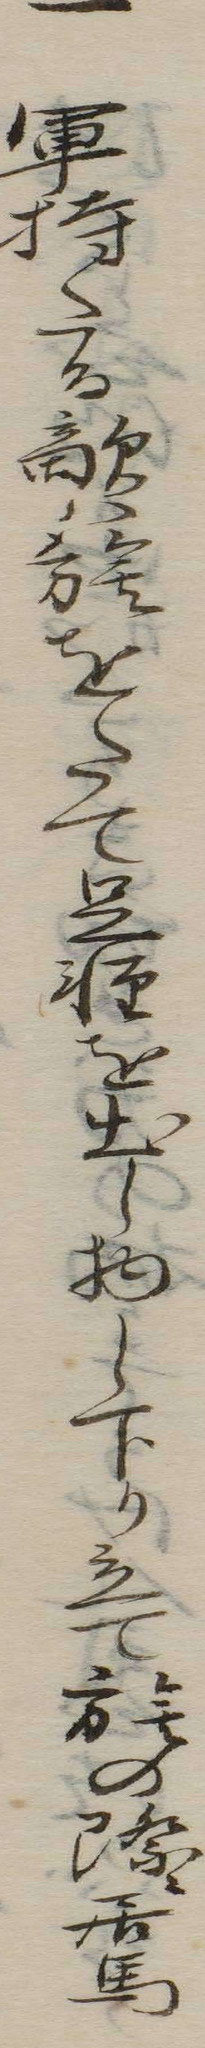一軍持たる敵は旗をたて足軽を出し物し下り立て旗の際ニ居馬
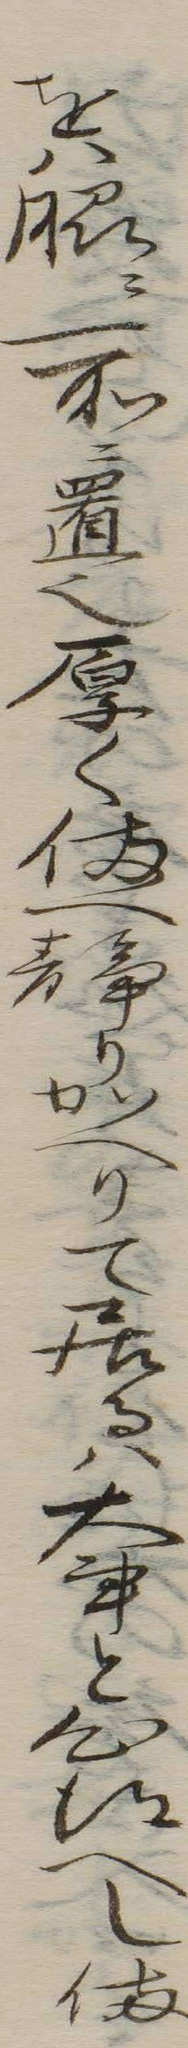をは脇ニ一所ニ置也厚く備へ静りかへりて居るは大事と心得へし備
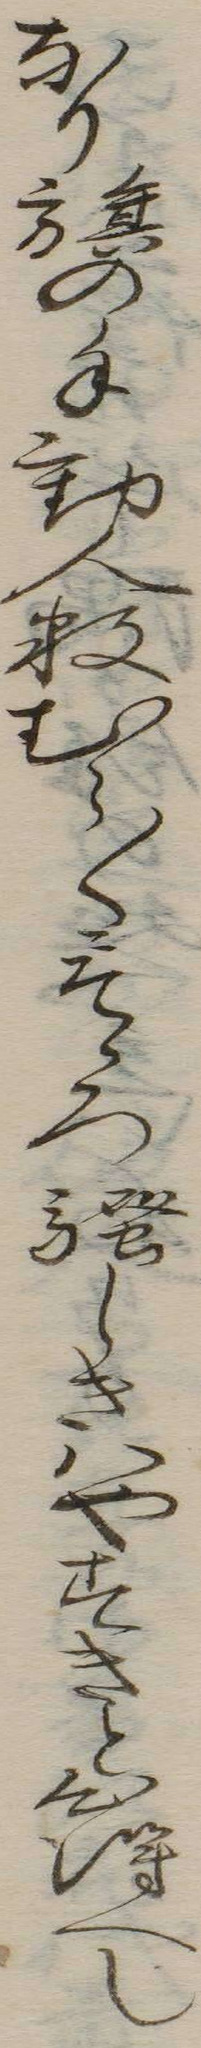なり旗の手動人数むら〳〵ニそゝろ騒しきはやすきと心得へし
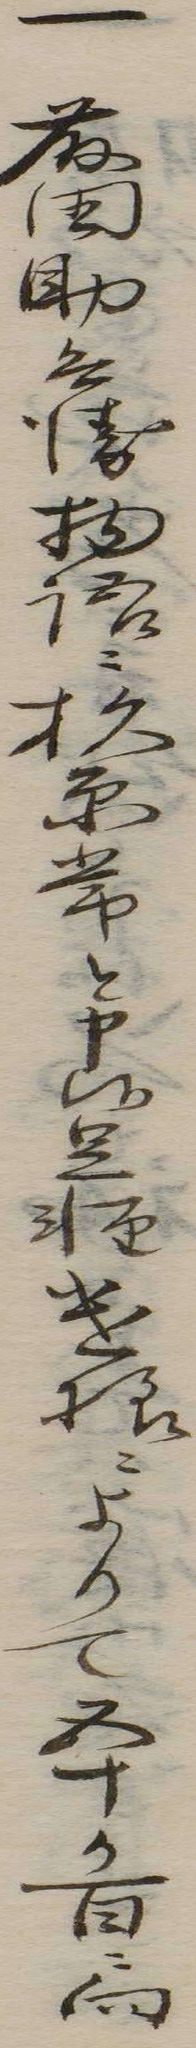一藤田助兵衛物語ニ杉原常と申候足軽遣様ニよりて五十か百ニ向
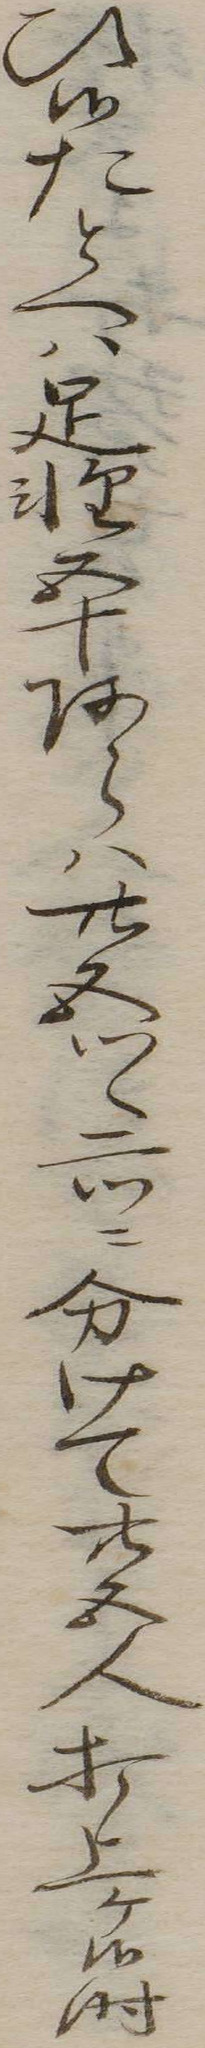ひ候たとへは足軽五十あらは廿五ツヽニツニ分けて廿五人打上ケ候時
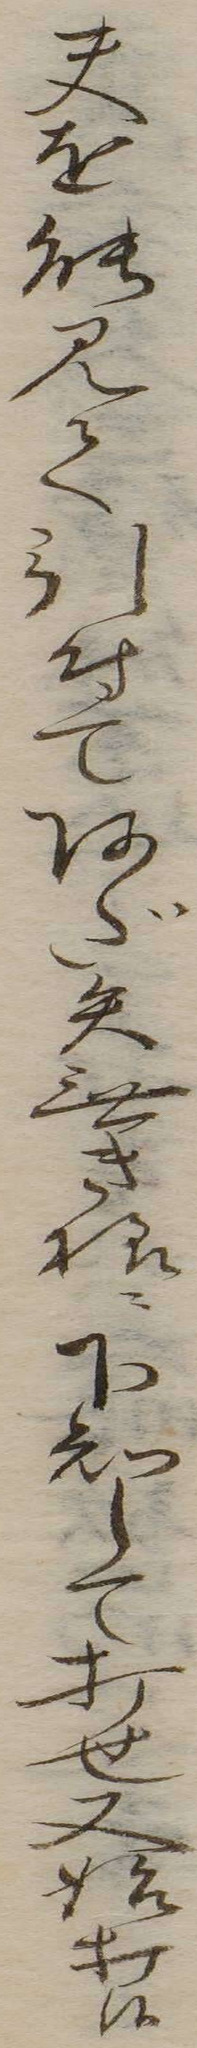夫を能見て引付てあだ矢無き様ニ下知して打せ又始打候

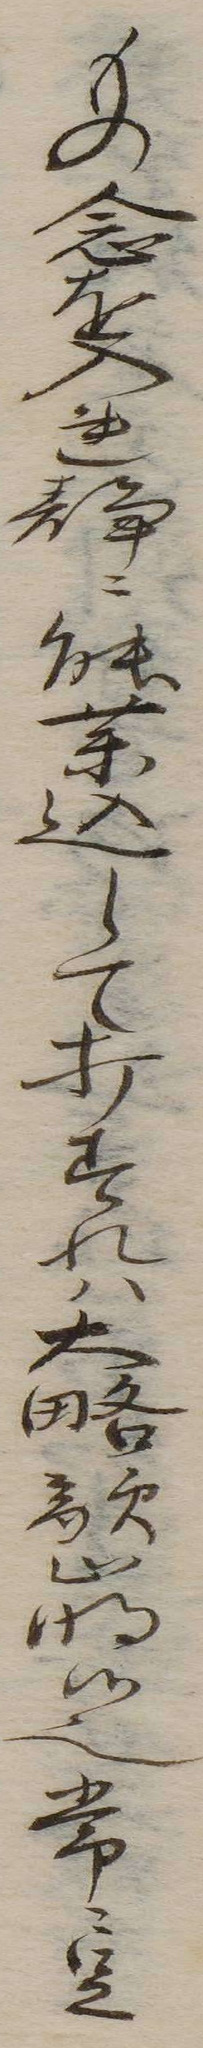もの念を入れ静ニ能薬込して打すれは大略敵崩候也常ニ足
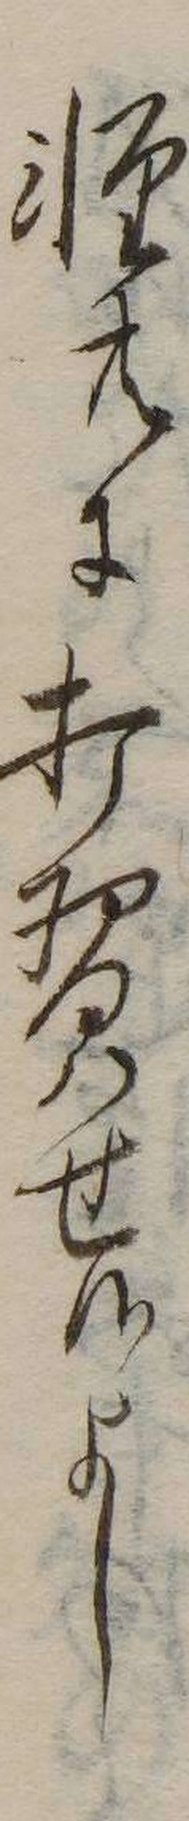軽共に打習はせ候よし
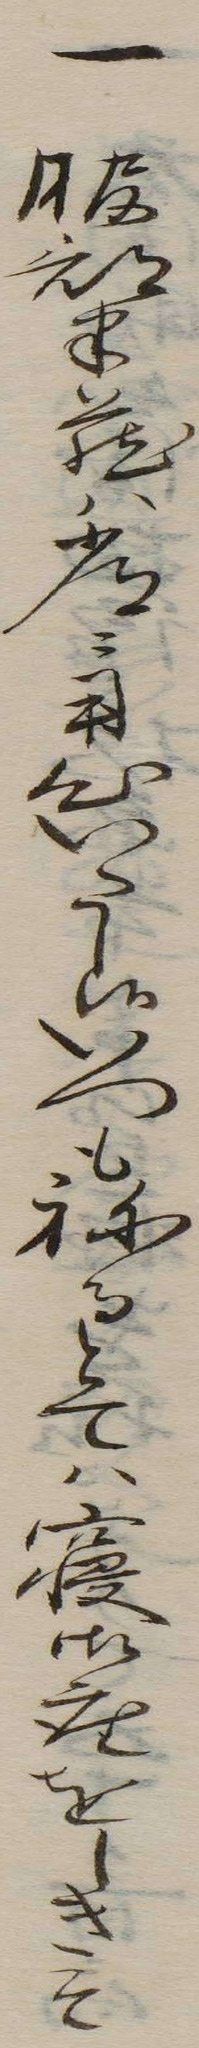一服部半蔵は常ニ用心いたし候いつもねるとては寝御座をしきそ
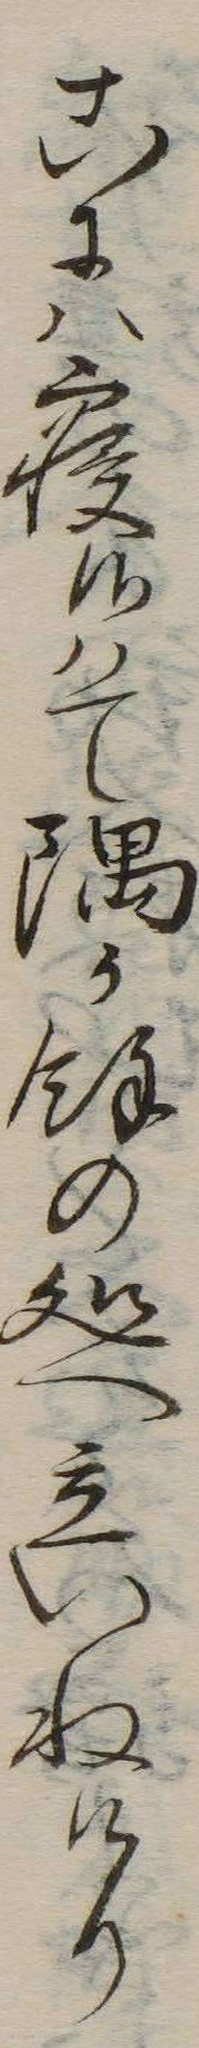こには寝候はて隅々余の処へ立いねけり
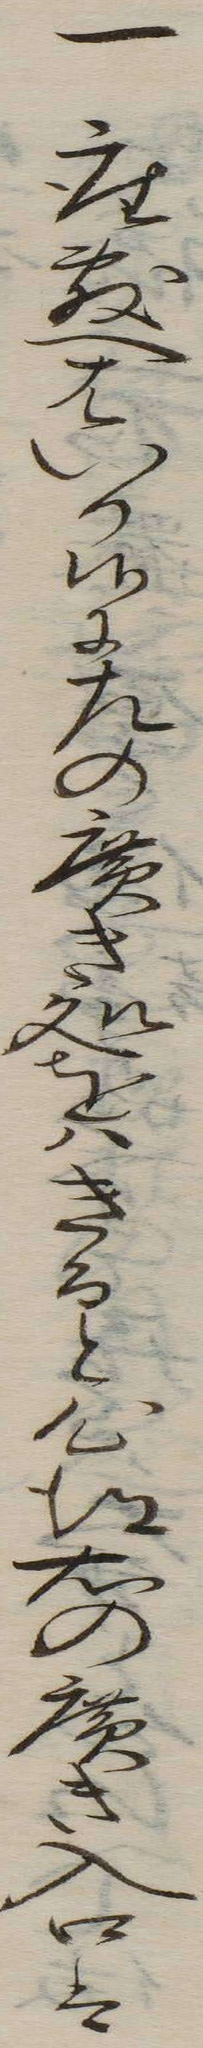一座敷へはいり候に左の広き処をはきると心得右の広き入口にて
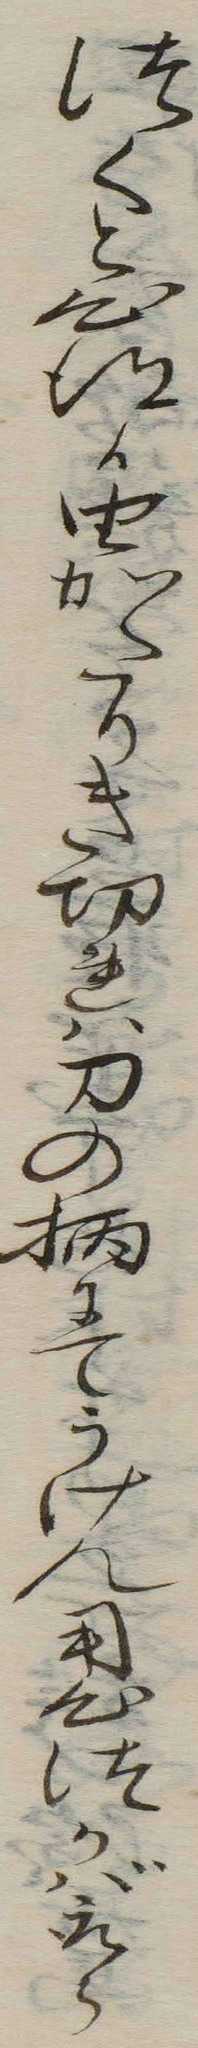つくと心得候由かたりき切れは刀の柄にてうけん用心つかば取ら
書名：三河之物語
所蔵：国文学研究資料館
